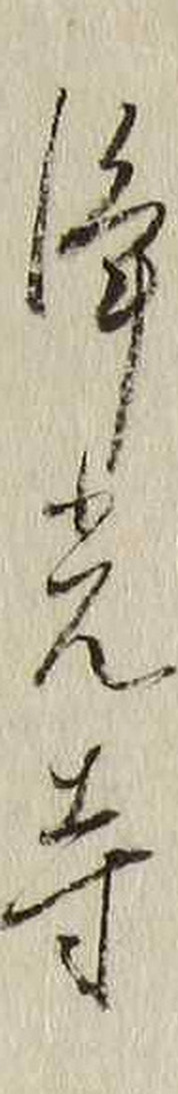浄光寺
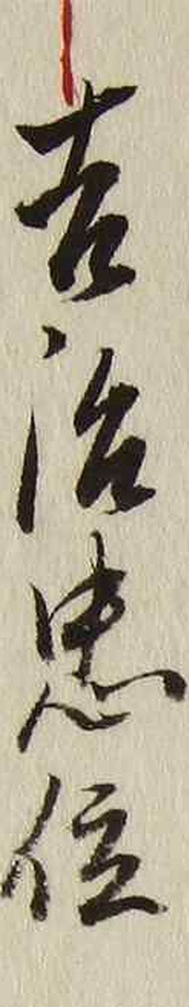吉治忠位
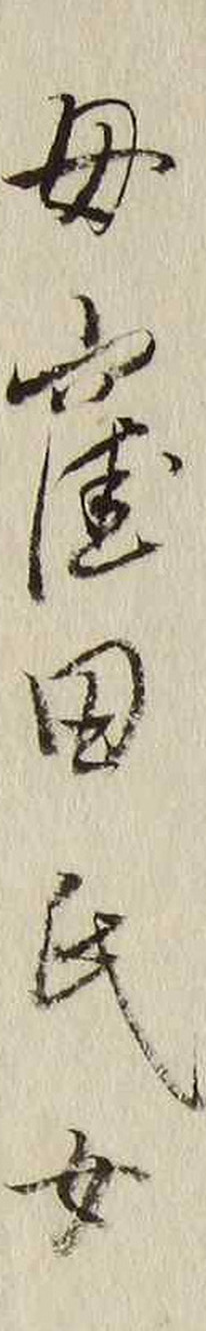母窪田氏女

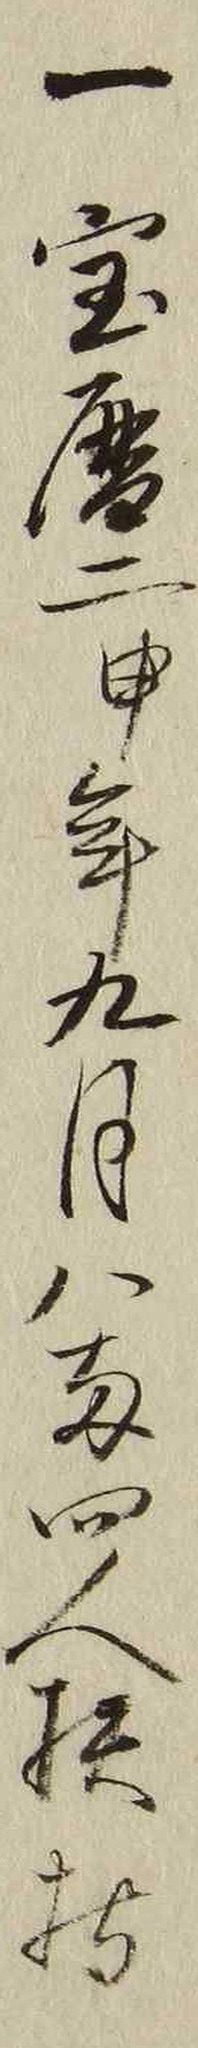一宝暦二申年九月八両四人扶持
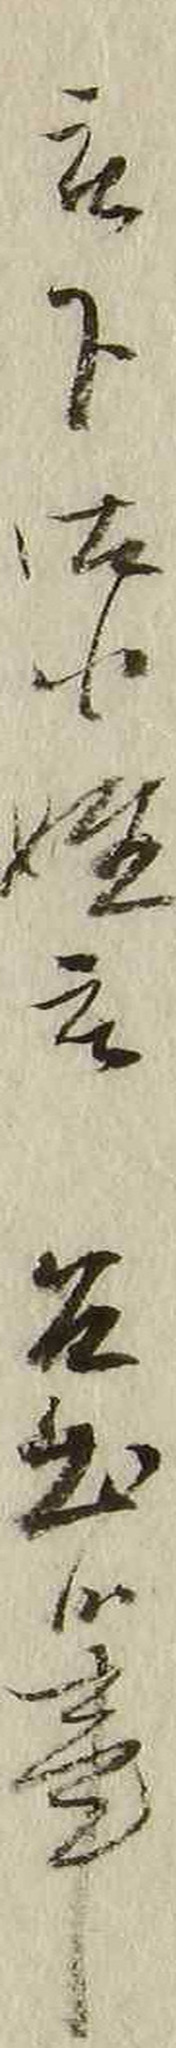被下御小姓被召出候事
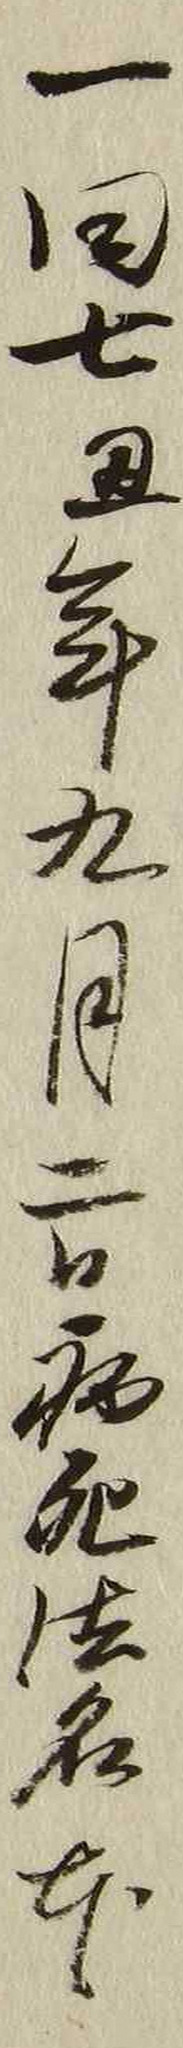一同七丑年九月二日病死法名本
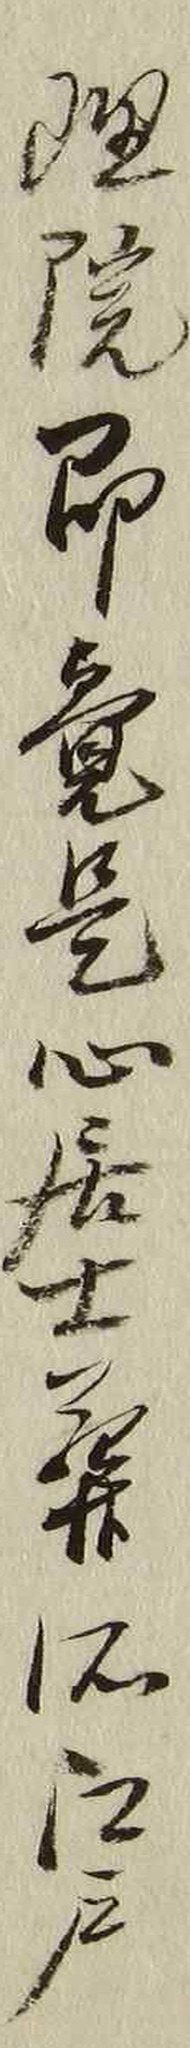理院即竟是心居士葬所江戸
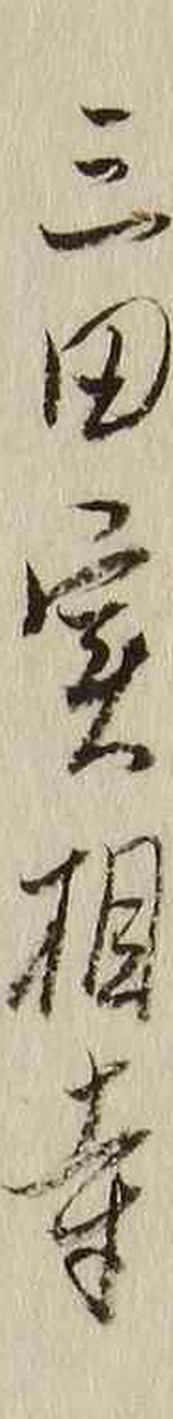三田実相寺
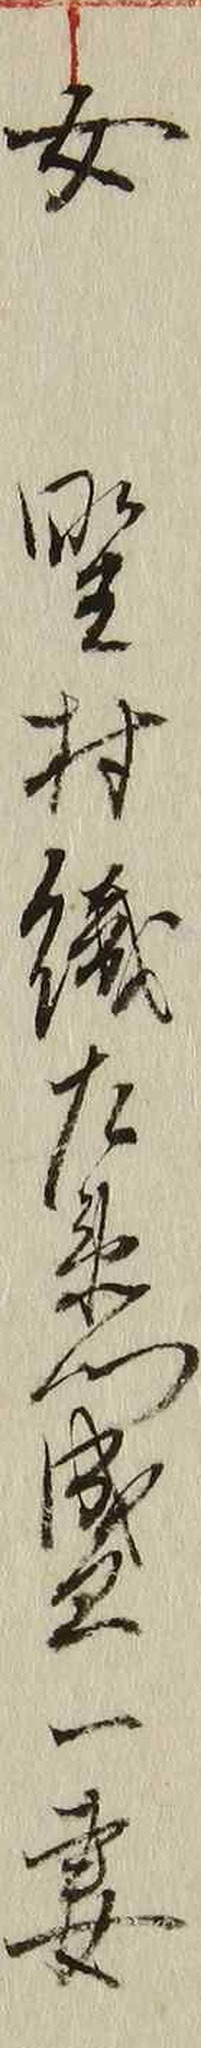女野村織左衛門盛一妻
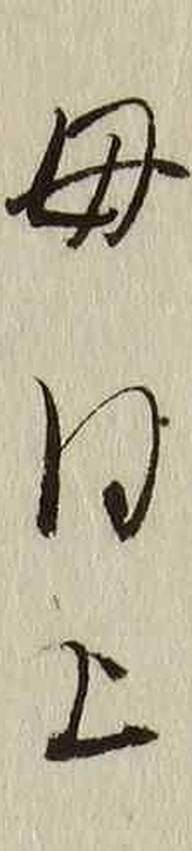母同上
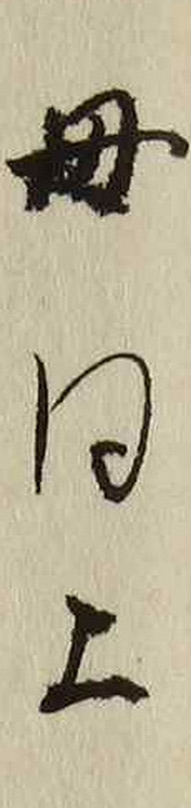母同上
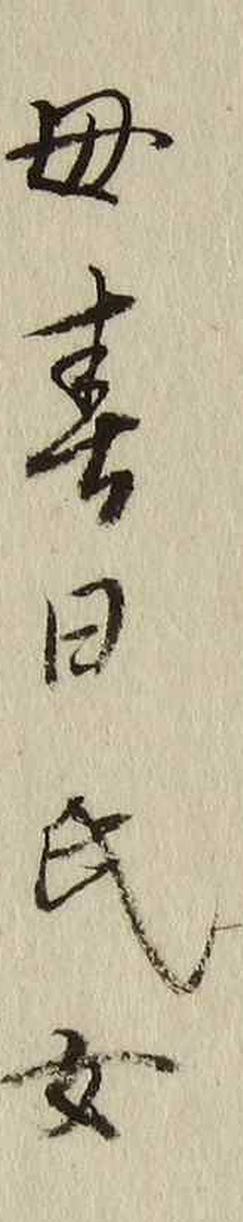母春日氏女
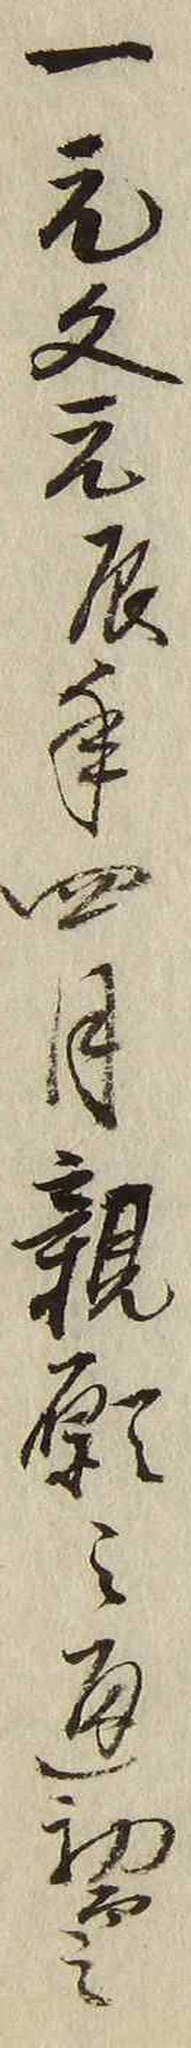一元文元辰年四月親願之通初而之

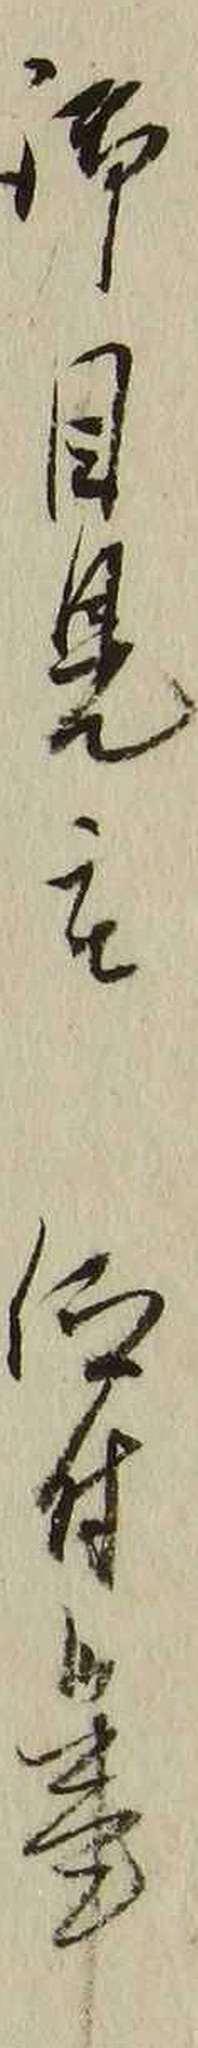御目見被仰付候事
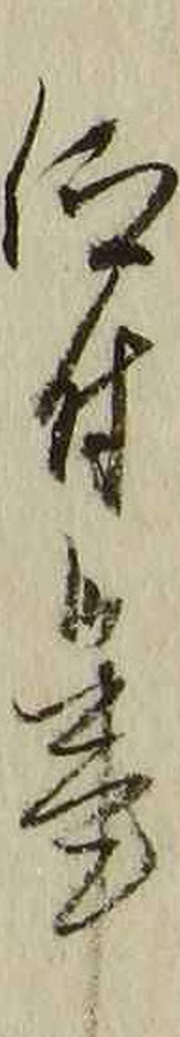仰付候事
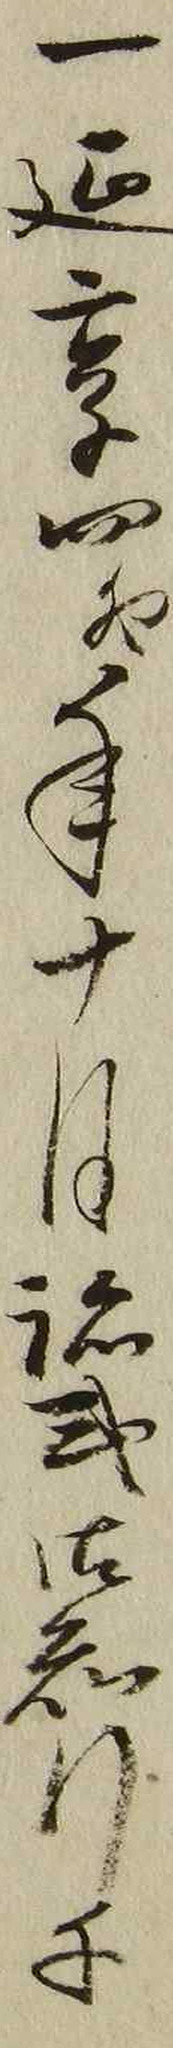一延享四卯年十月跡式御知行千
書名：諸士系譜　巻之351　す之部1
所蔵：会津若松市立会津図書館
